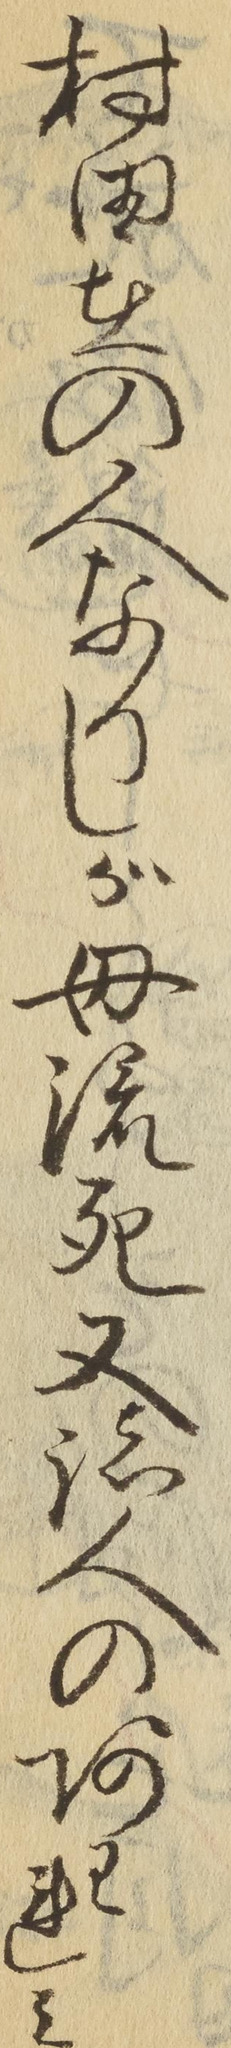村田在の人なりしが母流死又諸人のあわれみ

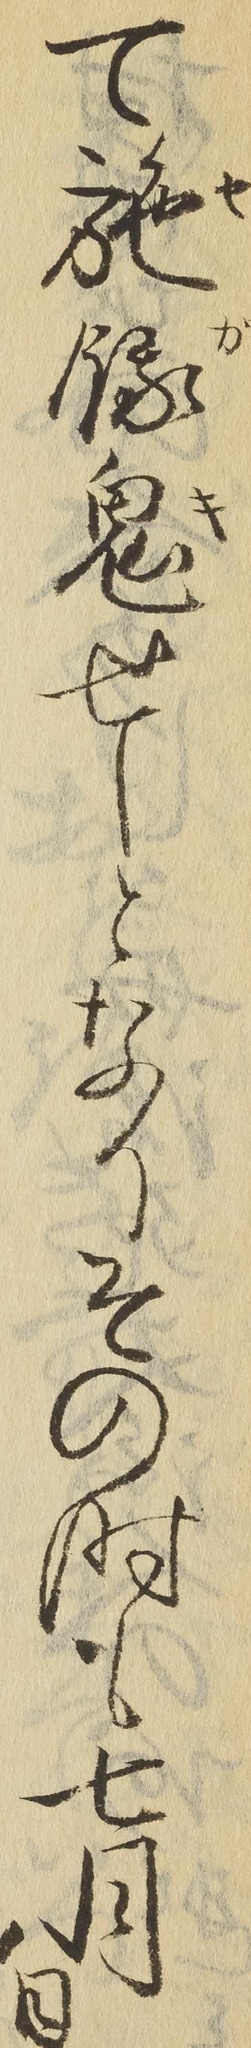て施餓鬼しとなりその時も七月八日
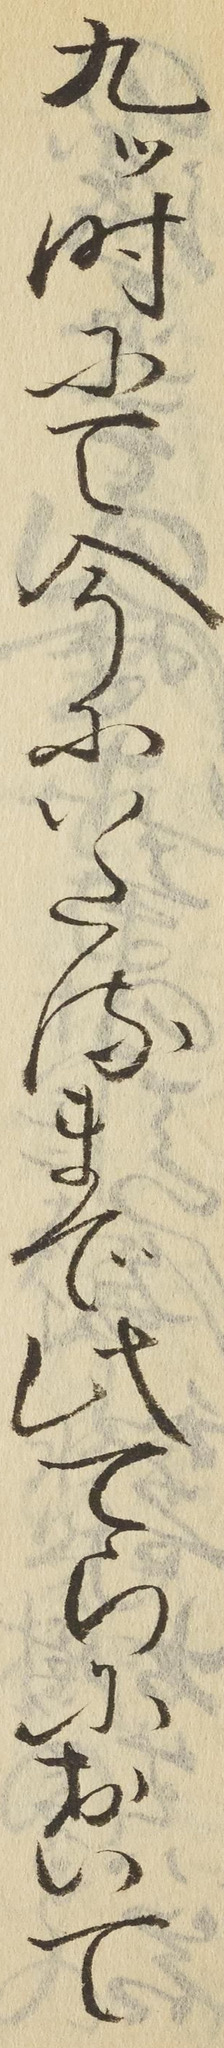九ッ時にて今にいたるまで此てらにおいて
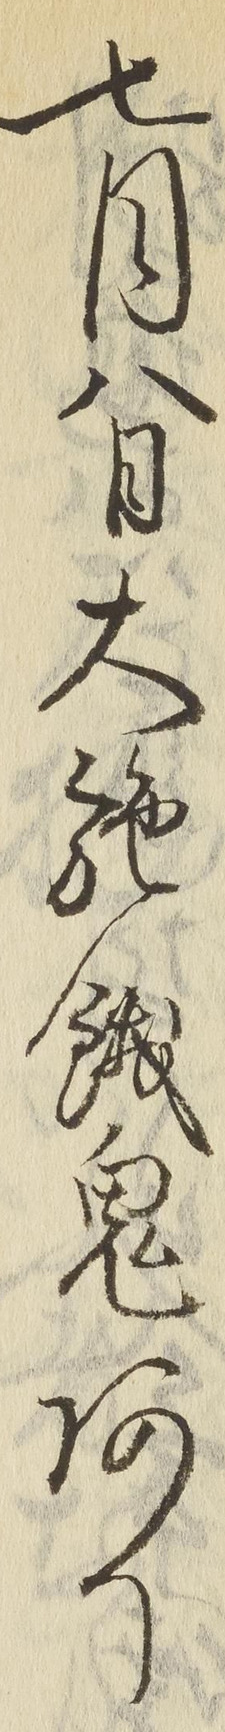七月八日大施餓鬼あり
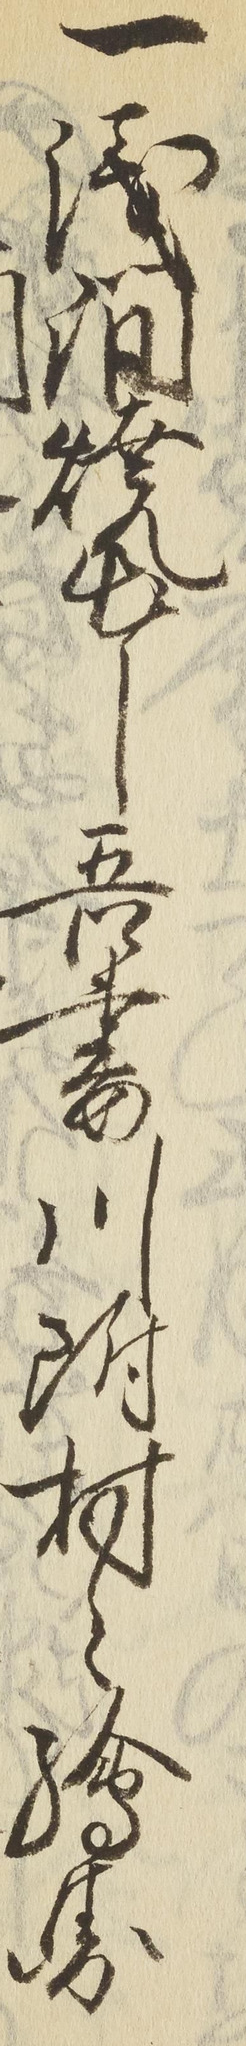一浅間焼出し吾妻川附村々絵圖
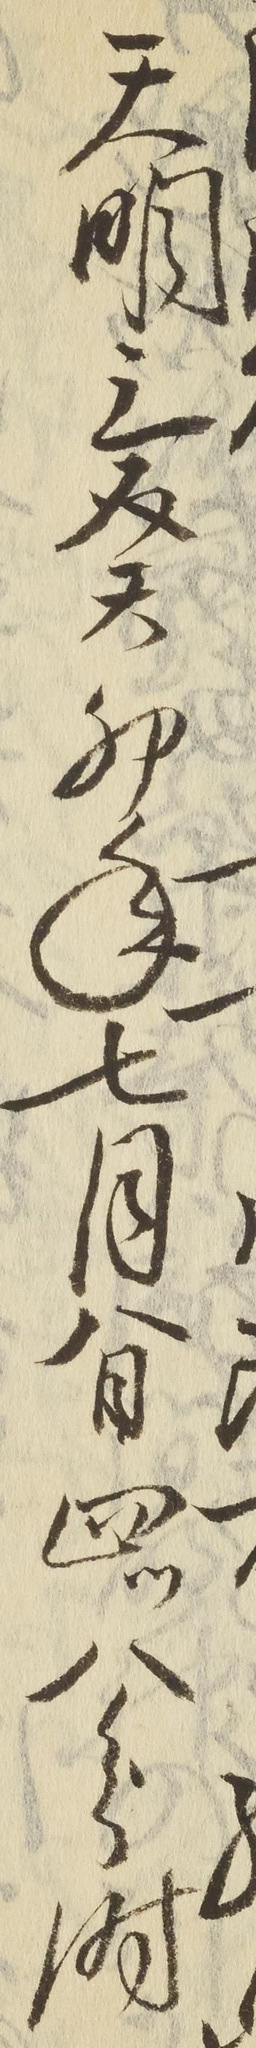天明三癸卯年七月八日四ッ八分時
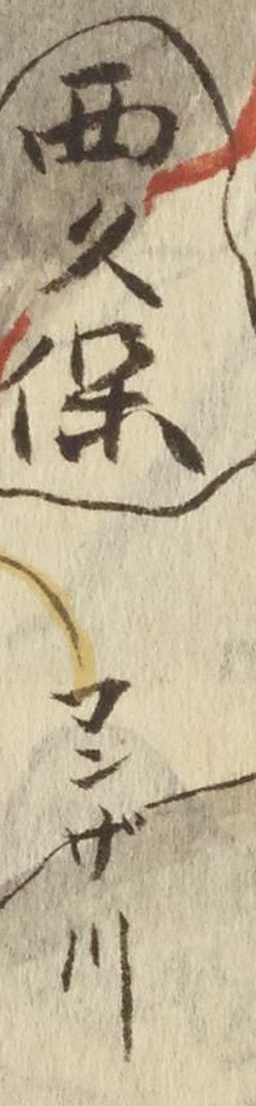西久保マンザ川

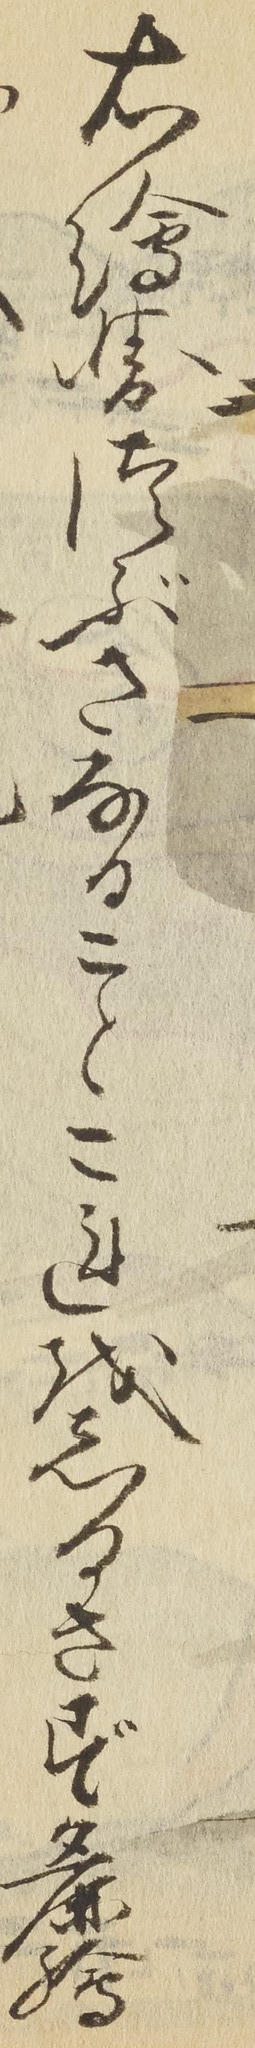右絵圖つぶさなることこれをしるさず
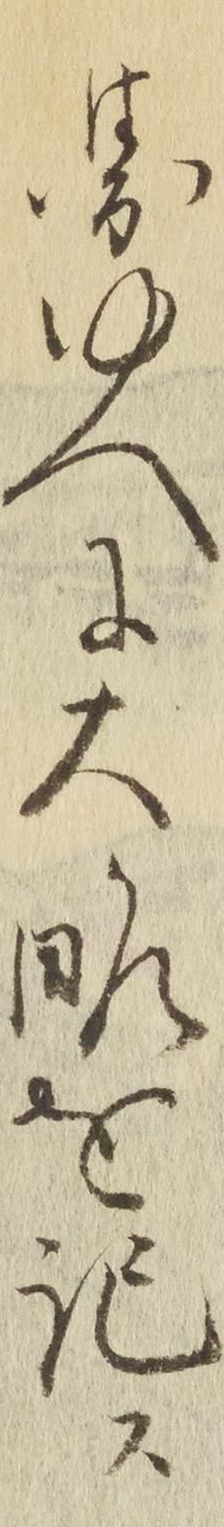頭ゆへに大略を記す
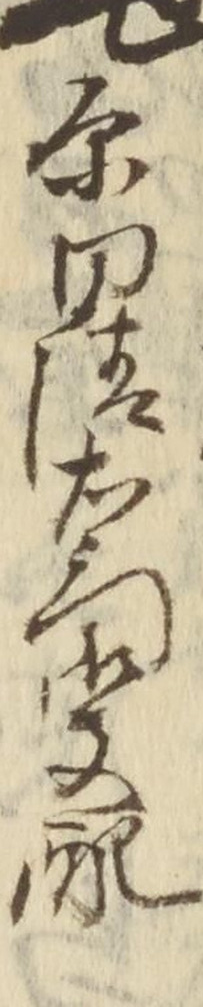原田清右衛門御支配
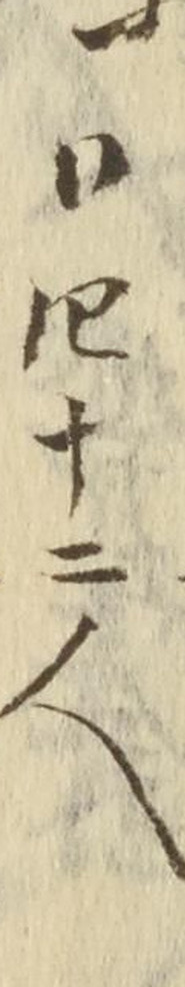同四十二人
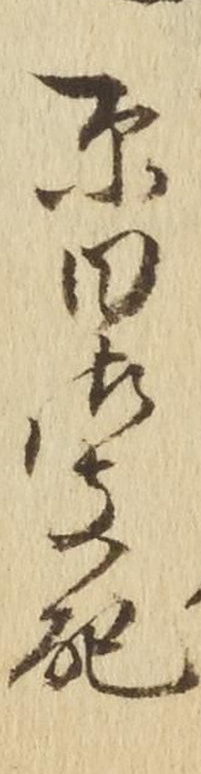原田御支配
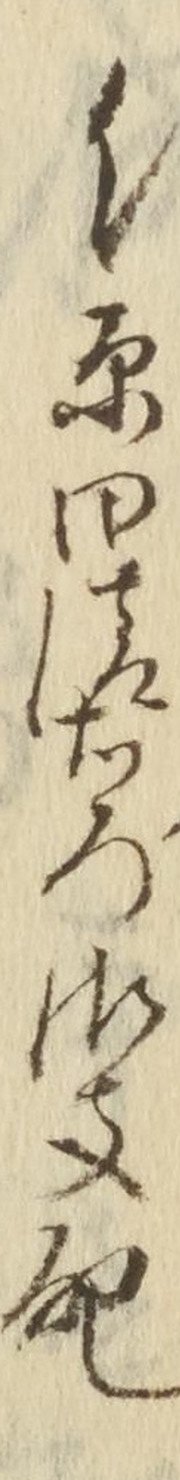原田清右衛門御支配
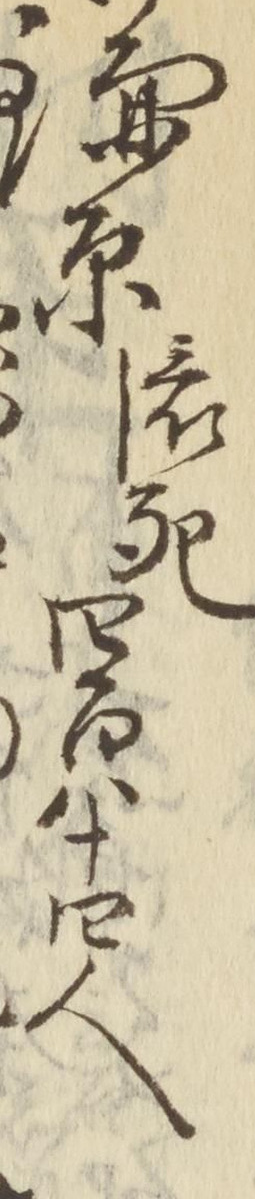鎌原流死四百八十四人
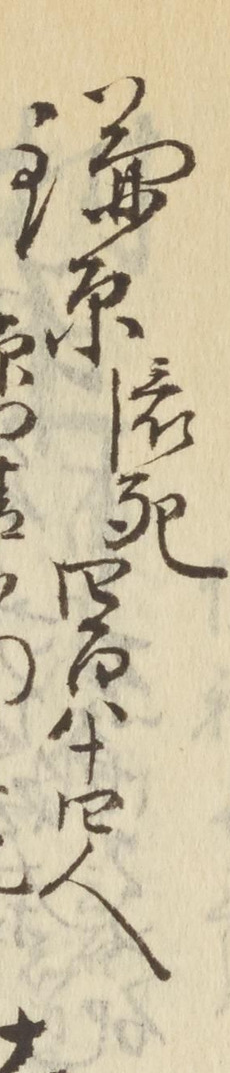鎌原流死四百八十四人
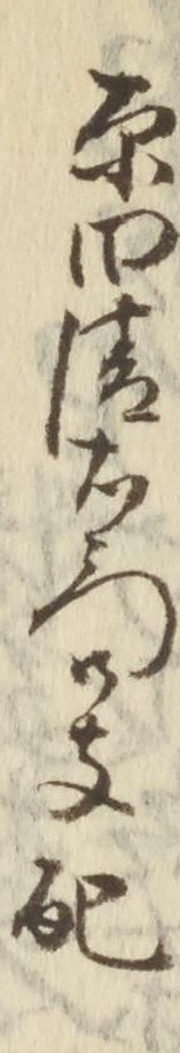原田清右衛門御支配
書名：浅間大變記
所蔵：東京大学地震研究所図書室 Earthquake Research Institute Library, The University of Tokyo, JAPAN
